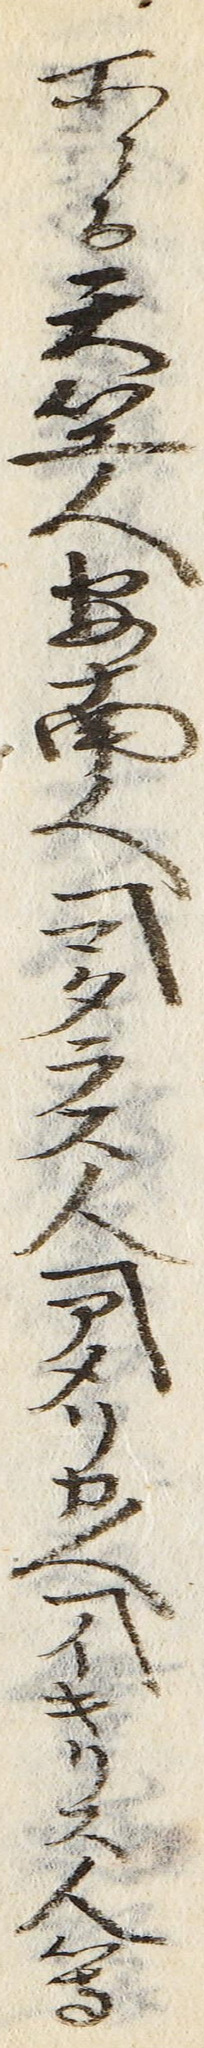所ニ而天竺人安南人「マタラス人「アメリカ人「イキリス人等
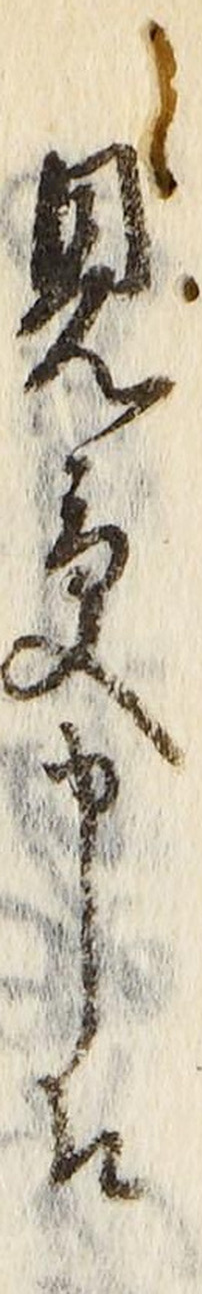見受申候
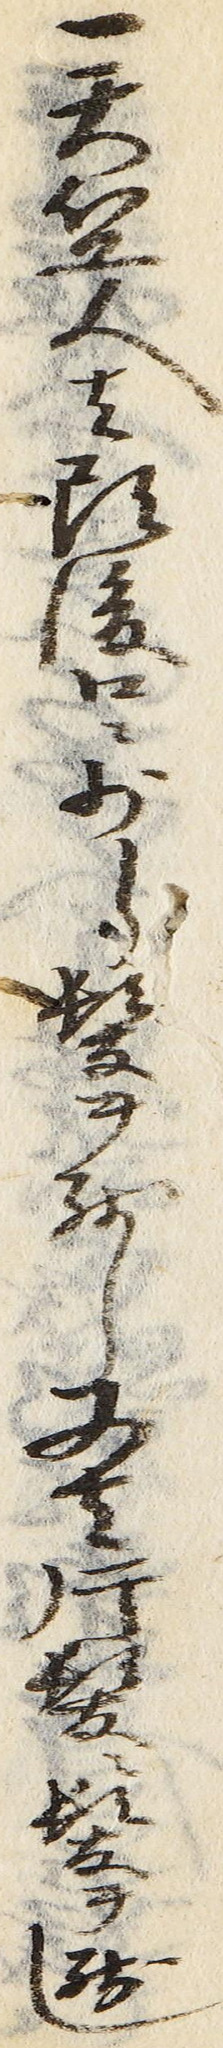一天竺人者頭後口似ニ少し髪ヲ残し又者片髪ニ髪ヲ残し
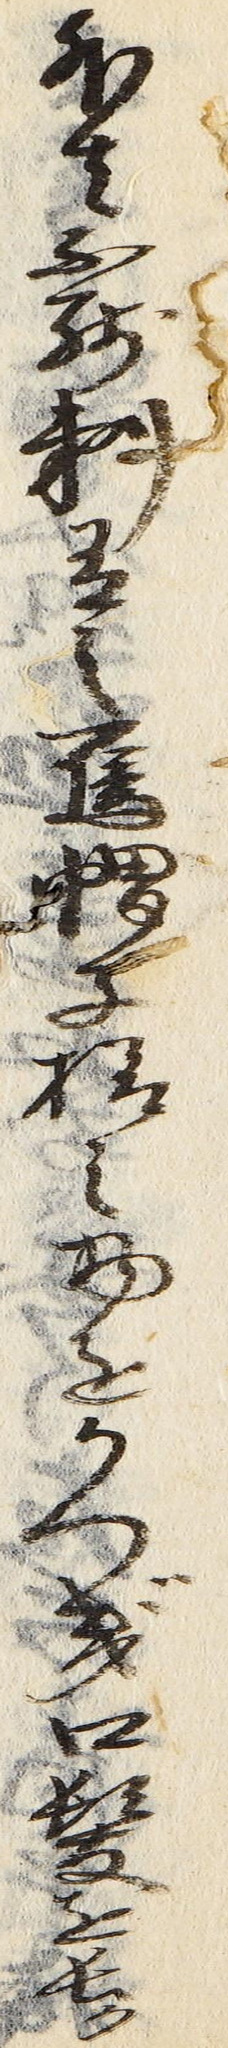外者不残剃有之鳥帽子様之物をかつぎ口髪を長ク
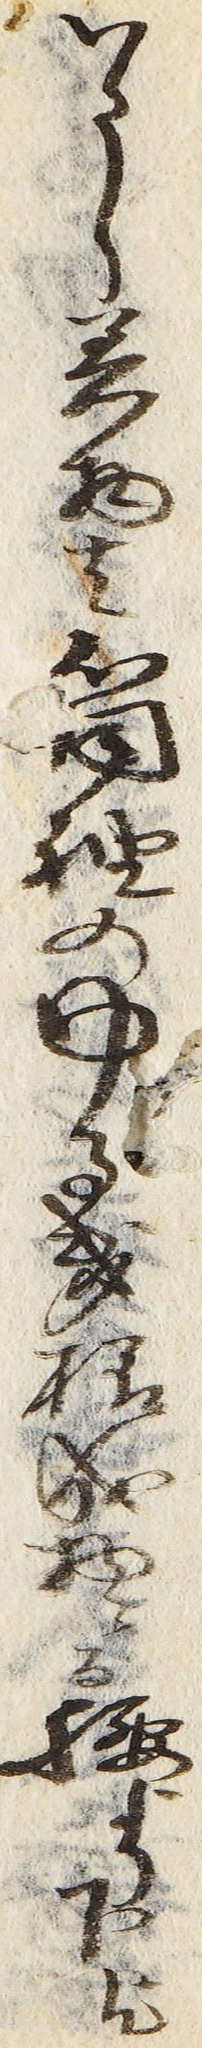いたし着物者筒袖のゆるき様成物ニ而腰より下江
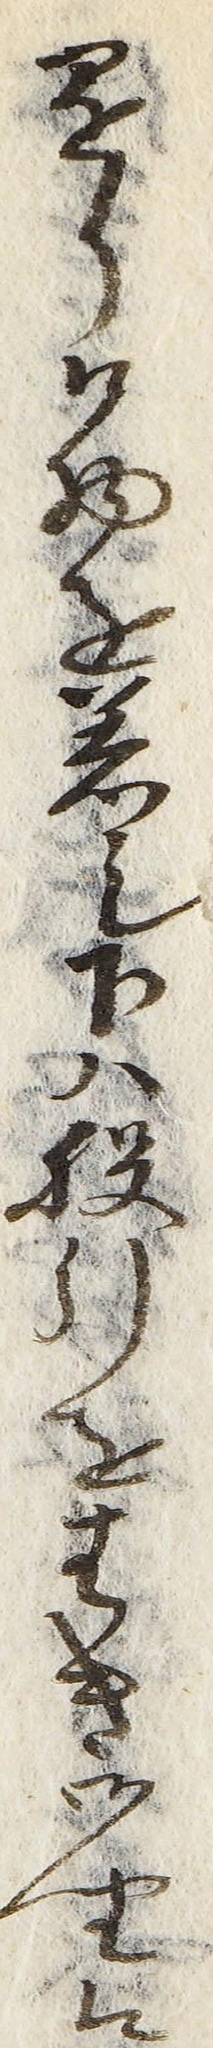懸り候物を着し下ハ股引をはき御座候
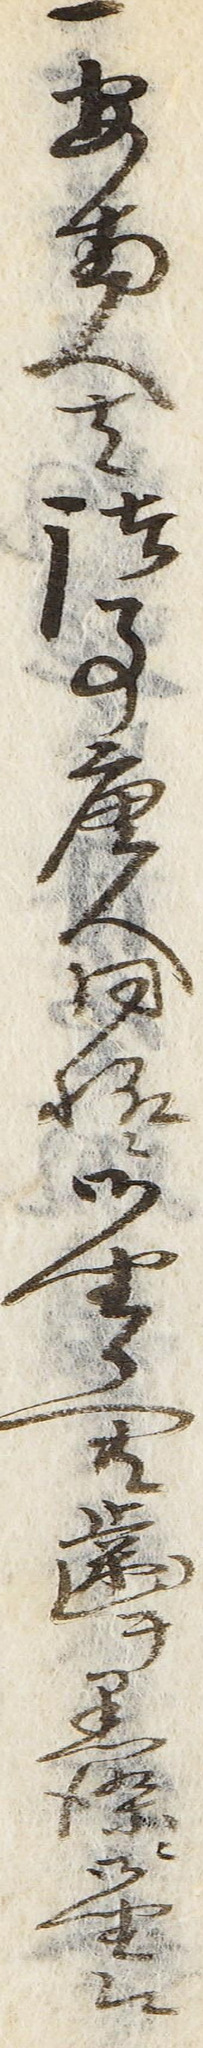一安南人者諸事唐人同様ニ御座候へ共歯ヲ黒染ニ御座候
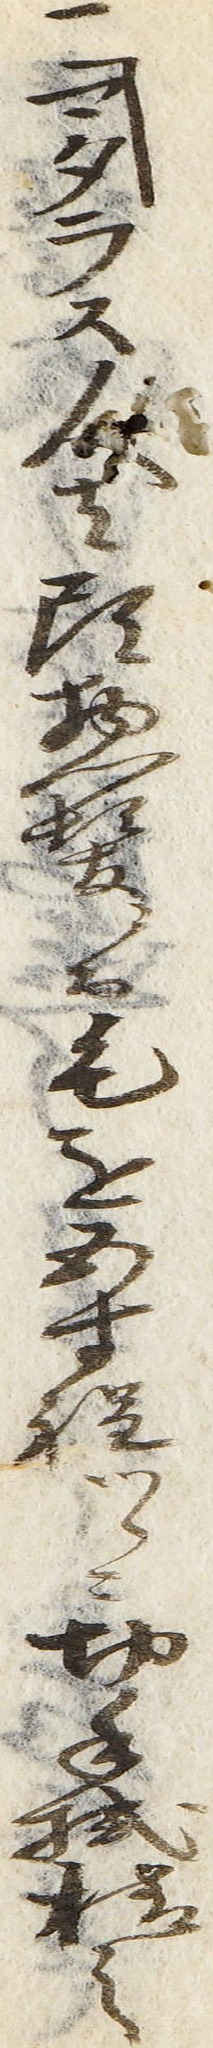一「マタラス人物頭惣髪ニ而毛を五寸程ツヽニ切手拭様之
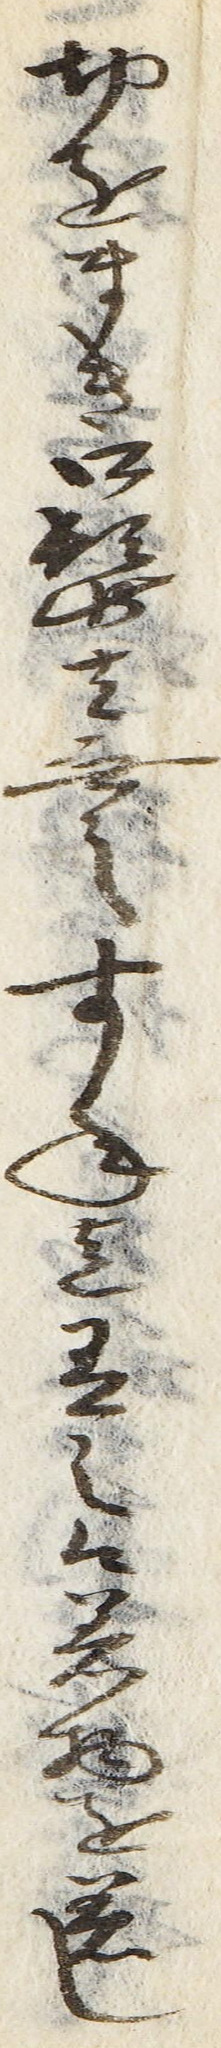切をまき口髯者無之すね迄有之候着物を着し
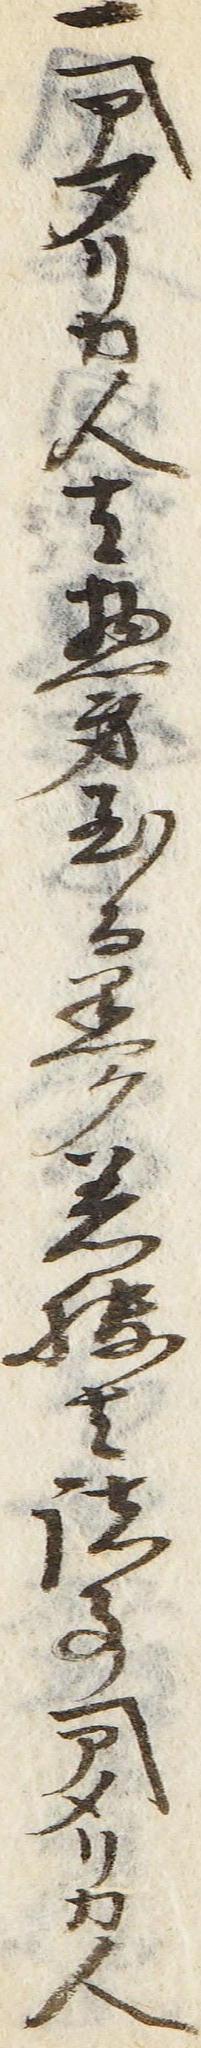一「アフリカ人者惣身至而黒ク着服者諸事「アメリカ人
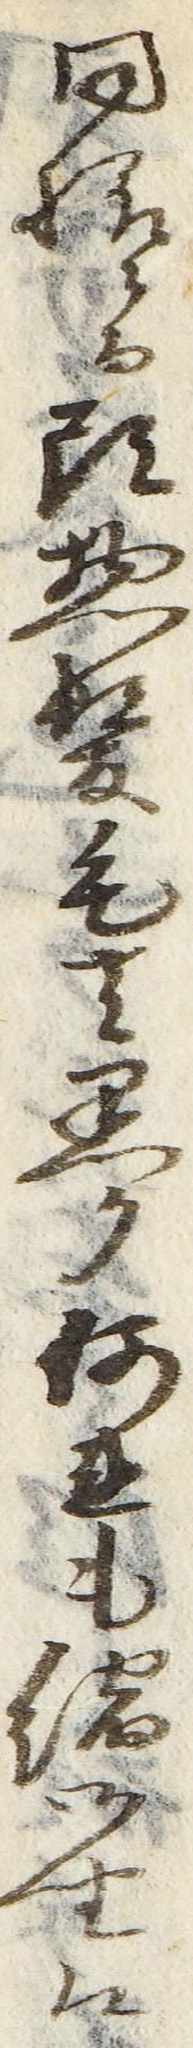同様ニ而頭惣髪毛者黒ク何れも縮御座候

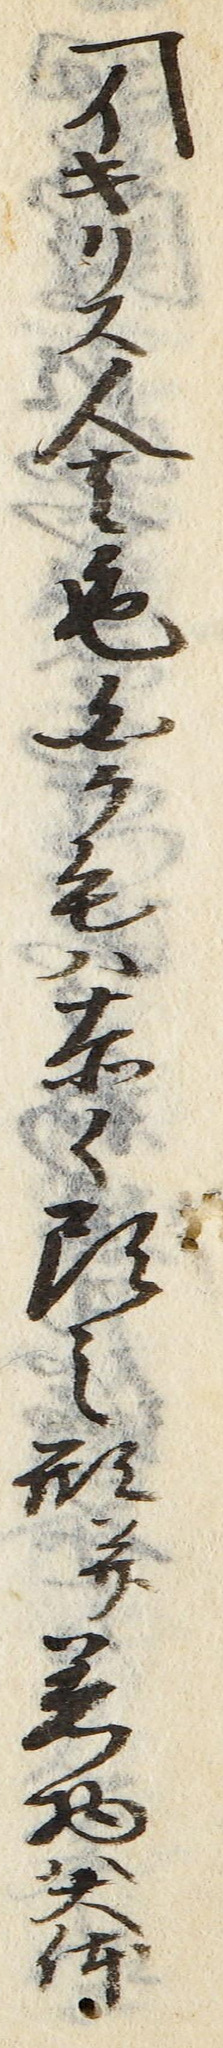「イキリス人者色白ク毛ハ赤く頭之形幷着物ハ大体
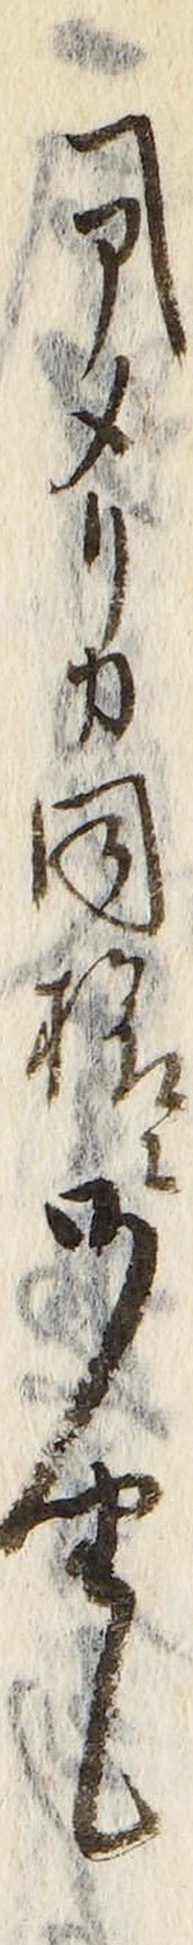「アメリカ同様ニ御座候
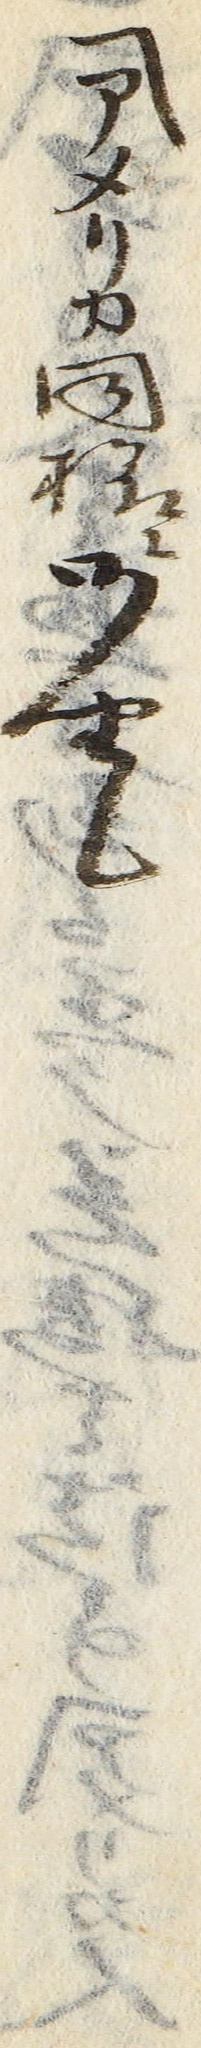「アメリカ同様ニ御座候
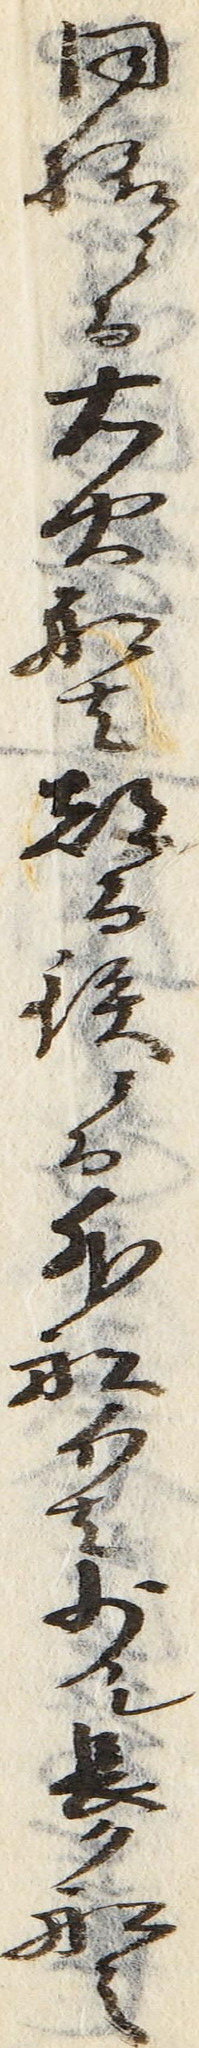同様ニ而右火舩者都而鉄ニ而外舩ゟ者少シ長ク舩之
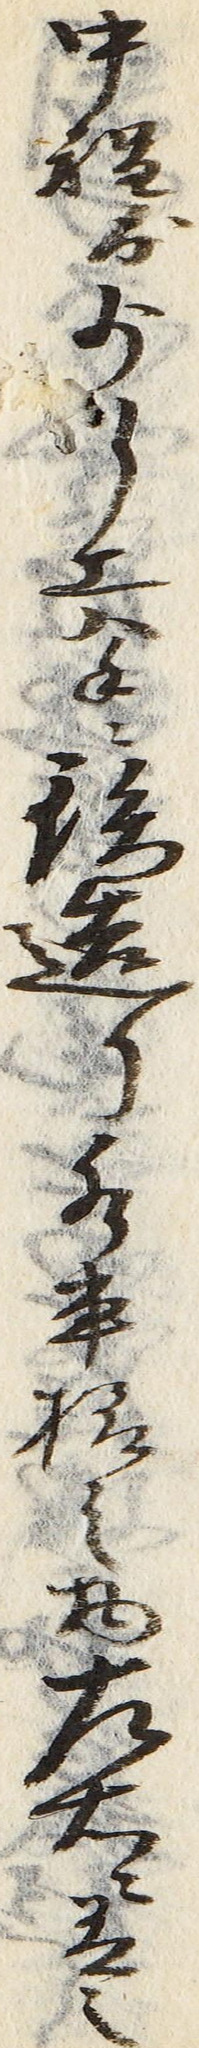中程ゟより上ハ手ニ鉄作水車様之物左右ニ有之
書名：漂流人善助聞書
